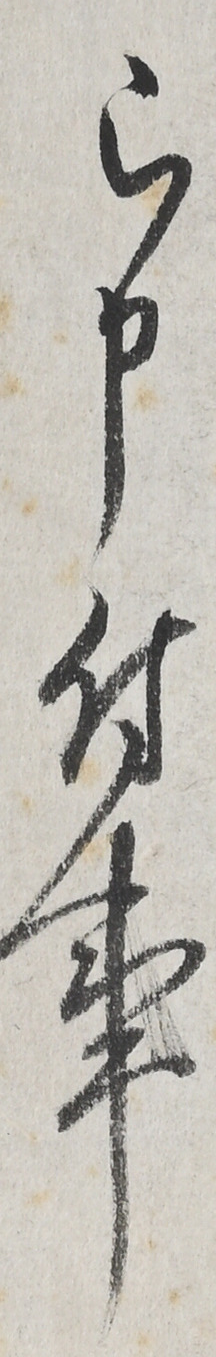被申付事
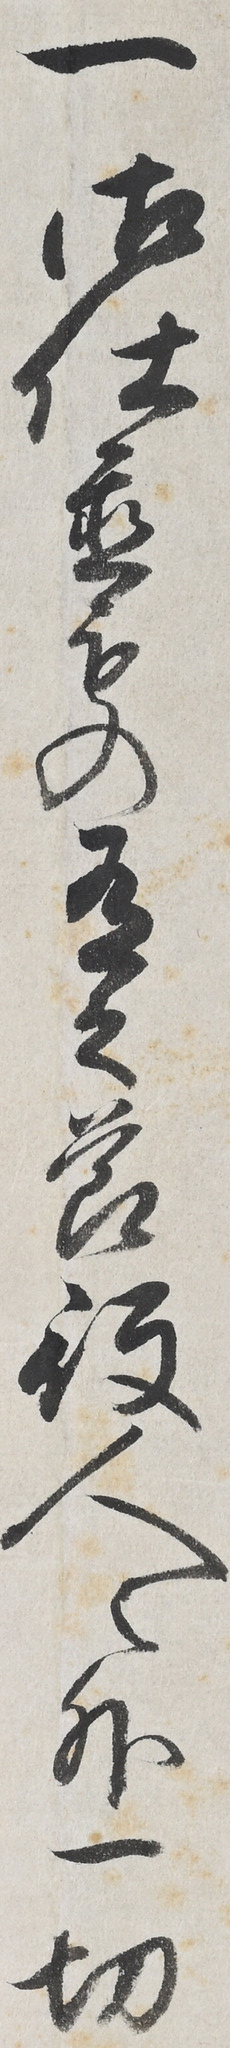一御仕置もの有之節役人之外一切
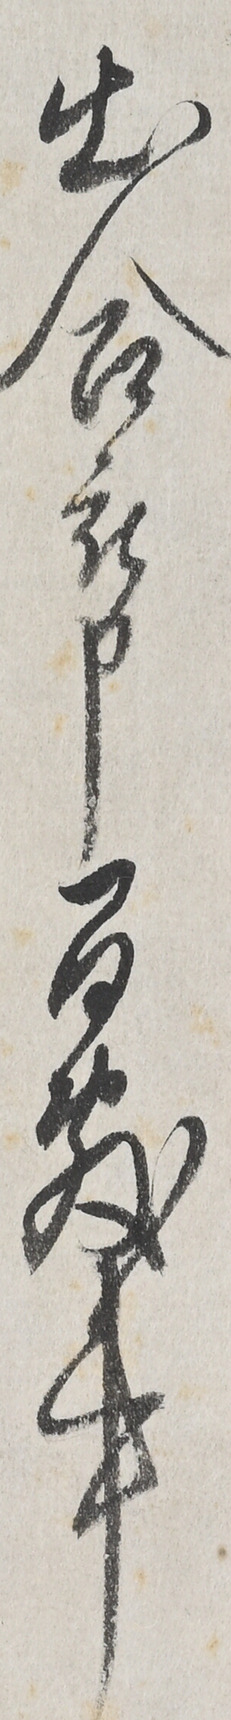出合被申間敷事
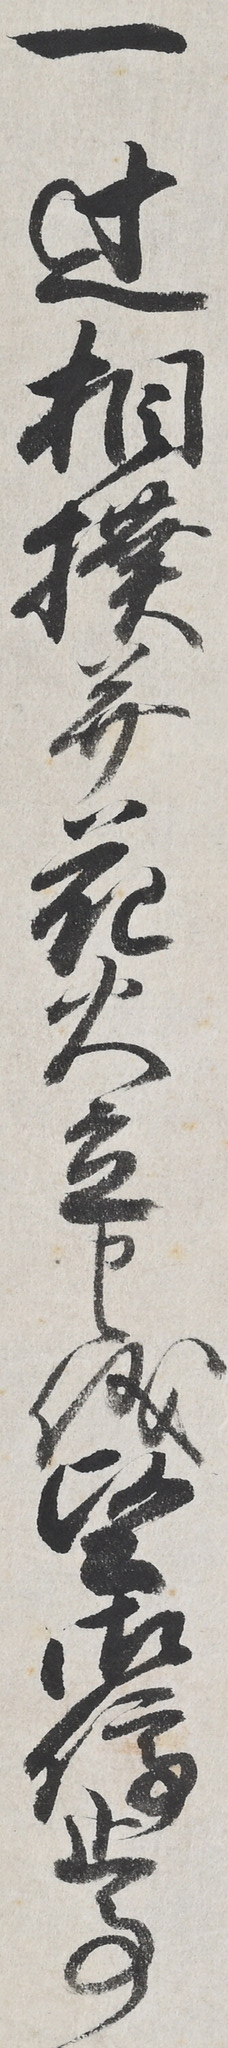一辻相撲幷花火立申候儀堅御停止事
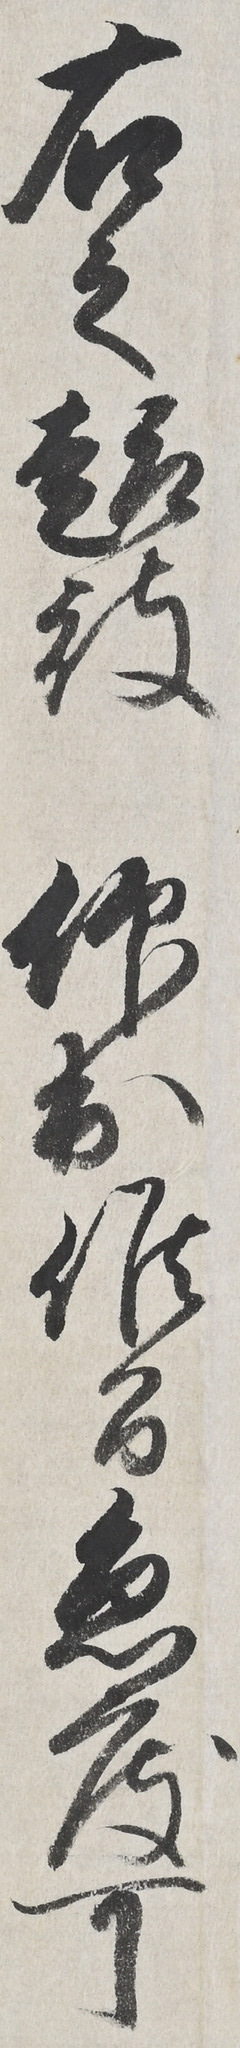右之趣被仰出候間急度可
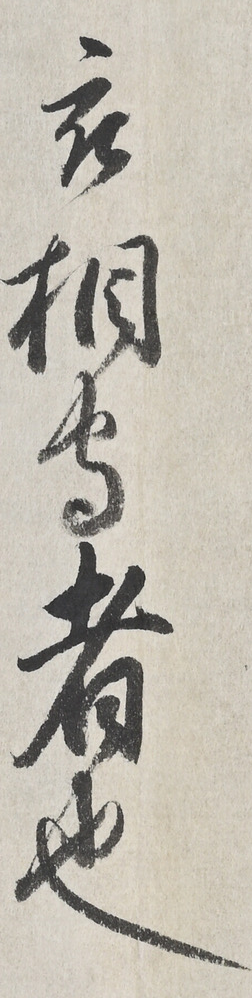被相守者也
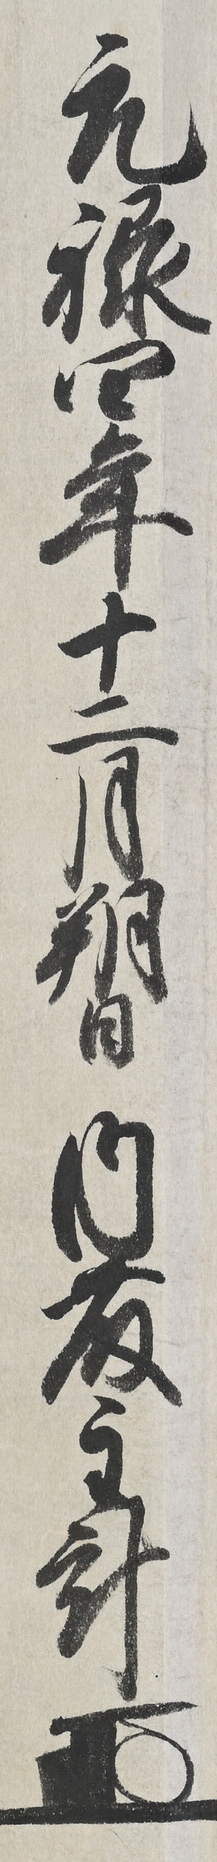元禄四年十二月朔日内藤主計

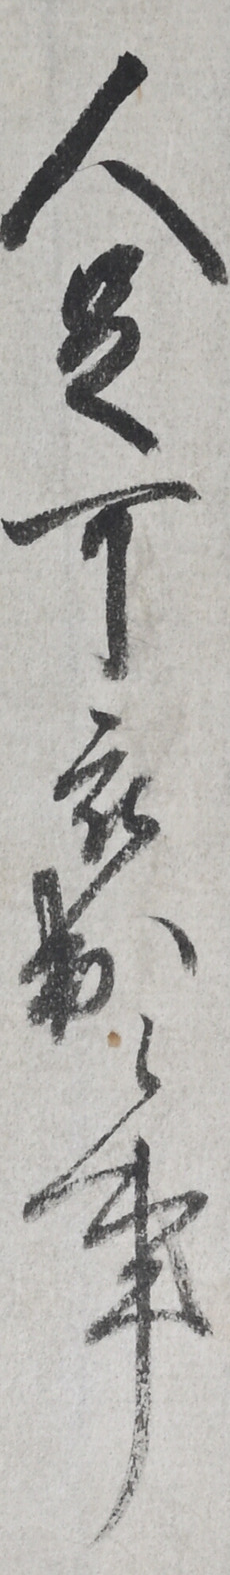人足可被出候事
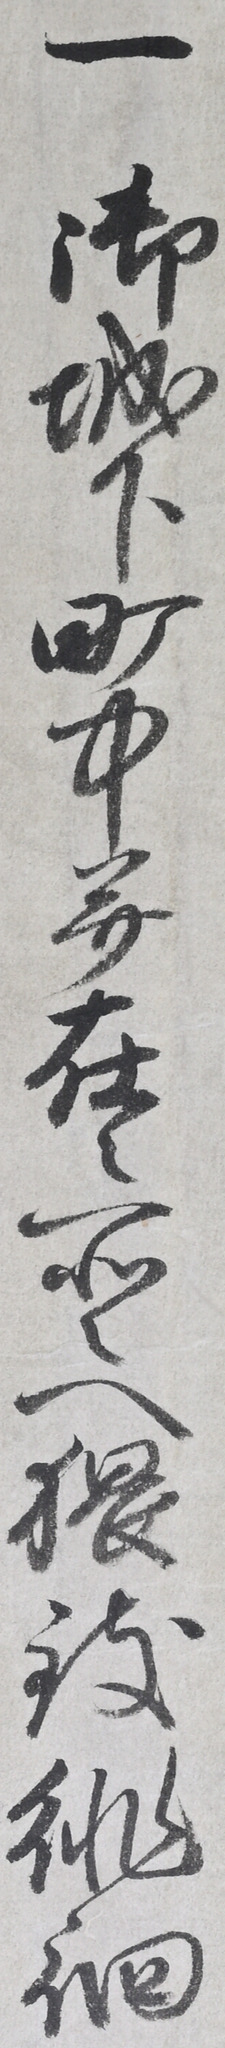一御城下町中幷在々所々へ猥致徘徊
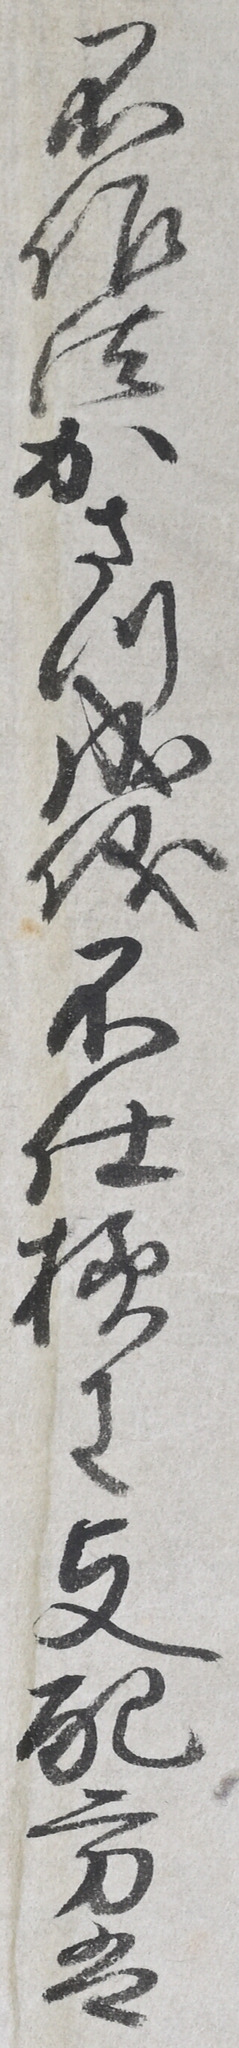不作法かさつ成儀不仕様に支配方は
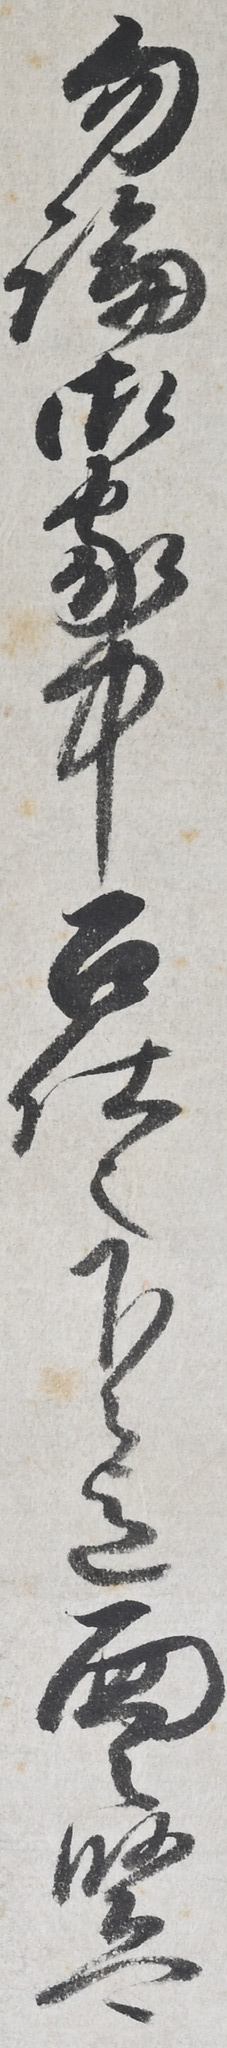勿論御家中召仕之下々迄面々堅可
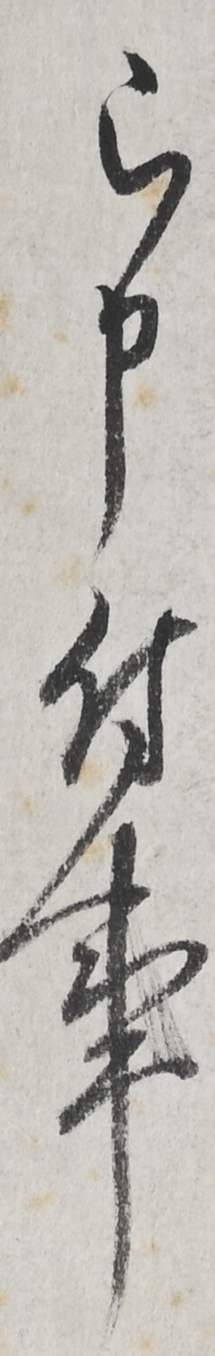被申付事
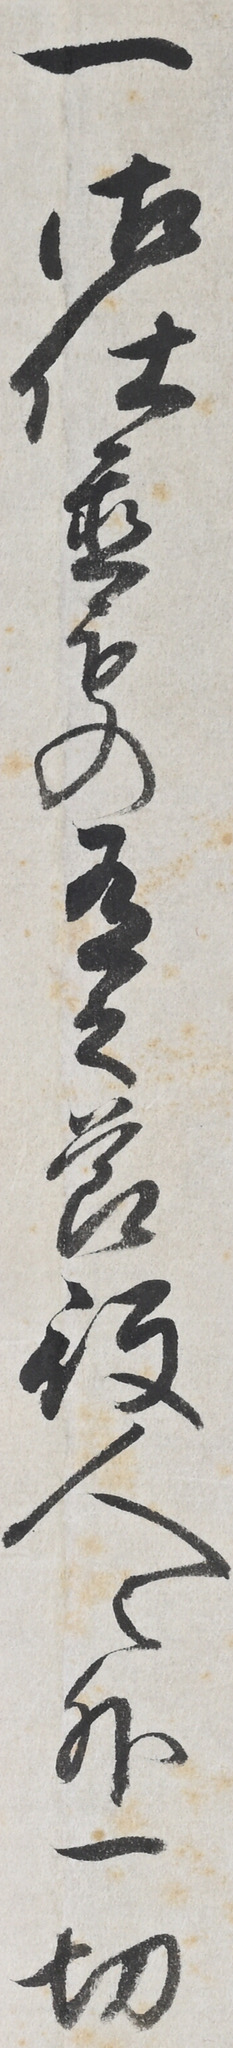一御仕置もの有之節役人之外一切
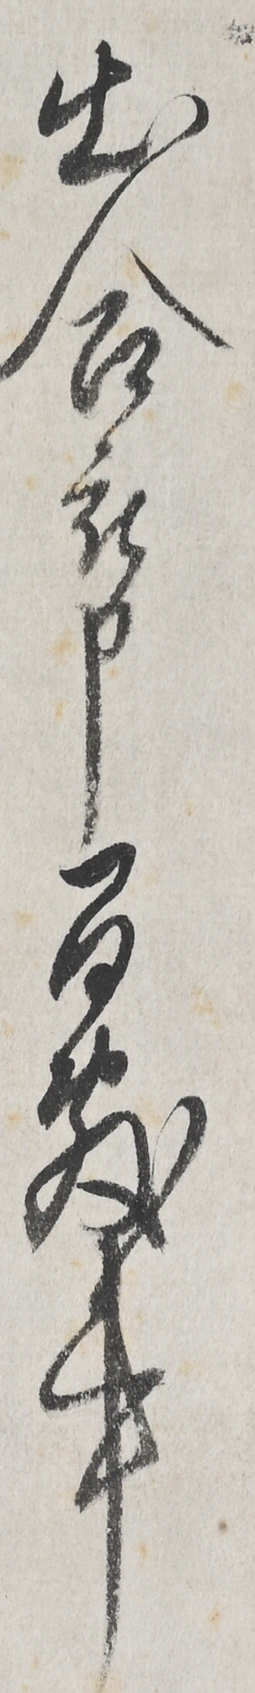出合被申間敷事
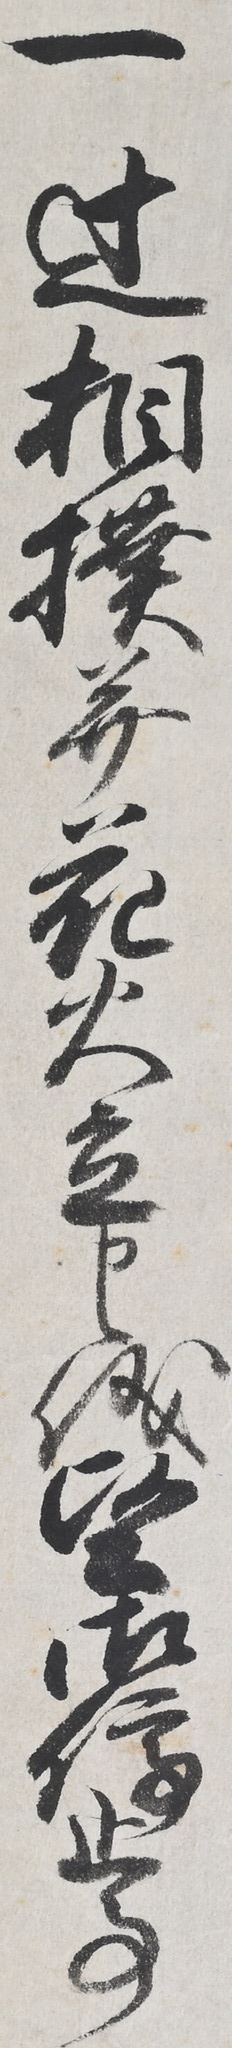一辻相撲幷花火立申候儀堅御停止事
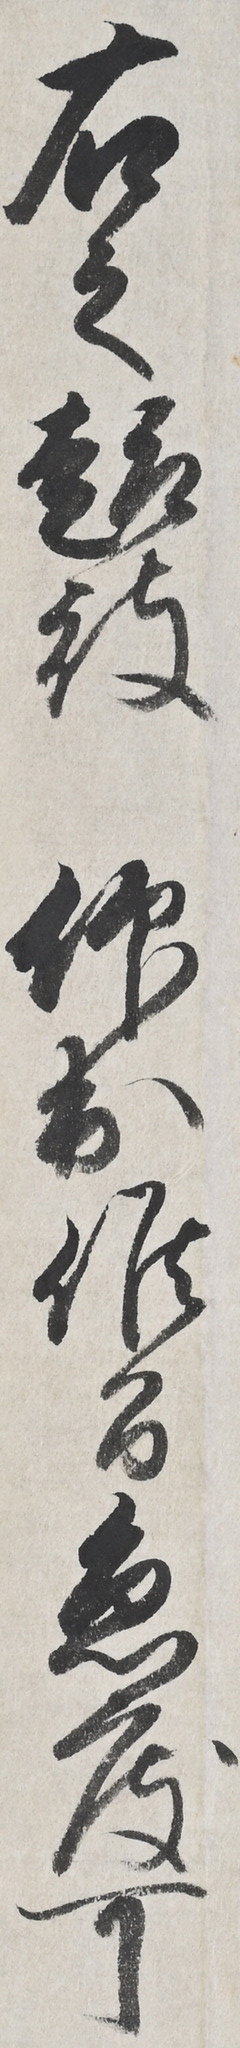右之趣被仰出候間急度可
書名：覚
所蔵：伊那市立高遠町図書館・合同会社AMANE
